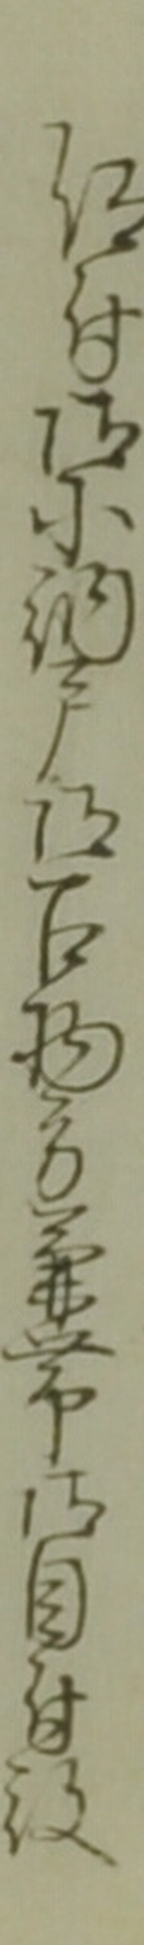仰付御小納戸御召物方兼帯御目付役
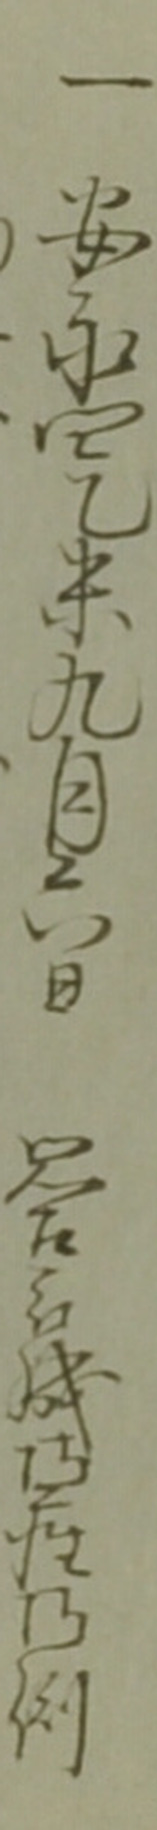一安永四乙未九月六日思召被成御座御側
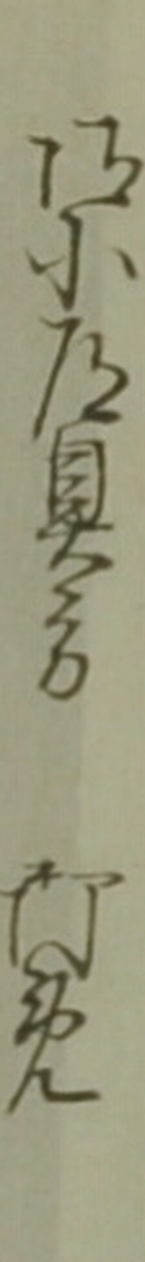御小道具方御免
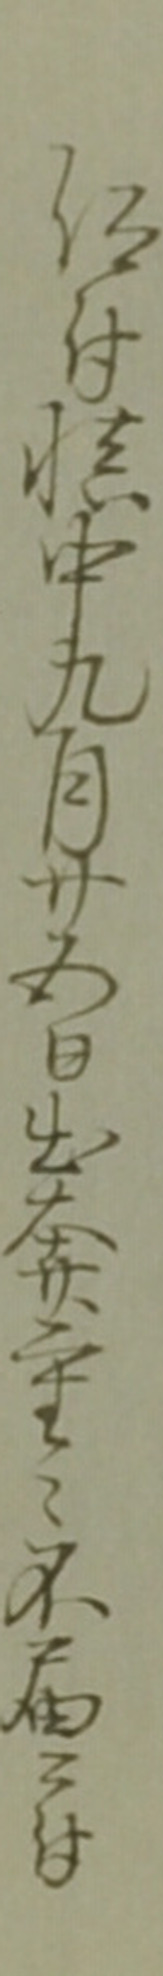仰付慎中九月廿五日出奔重々不届ニ付
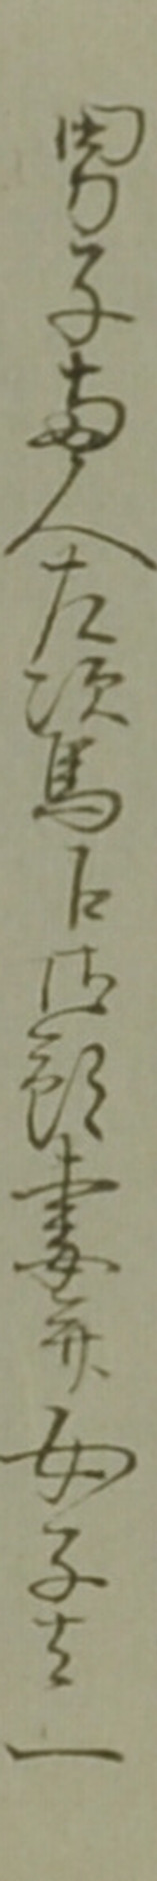男子両人左次馬江御預妻幷女子者一
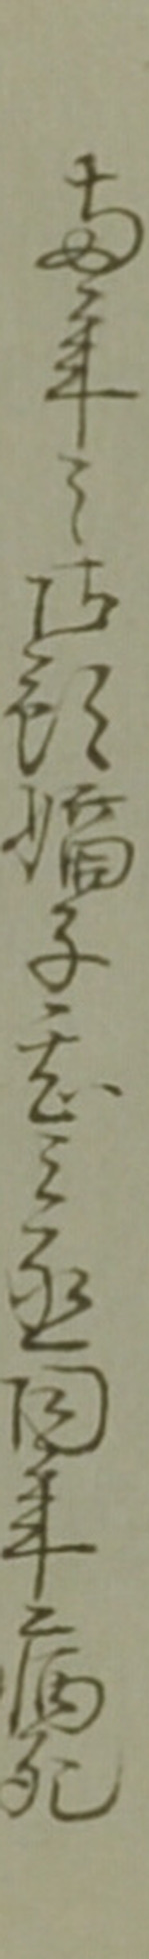両年之御預嫡子甚之丞同年病死
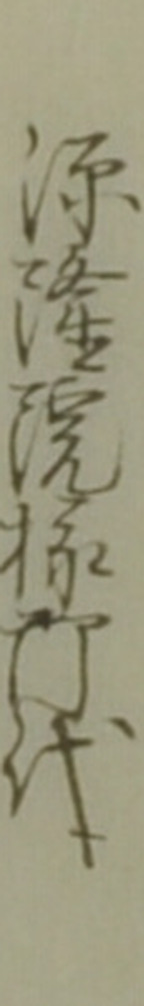源隆院様御代
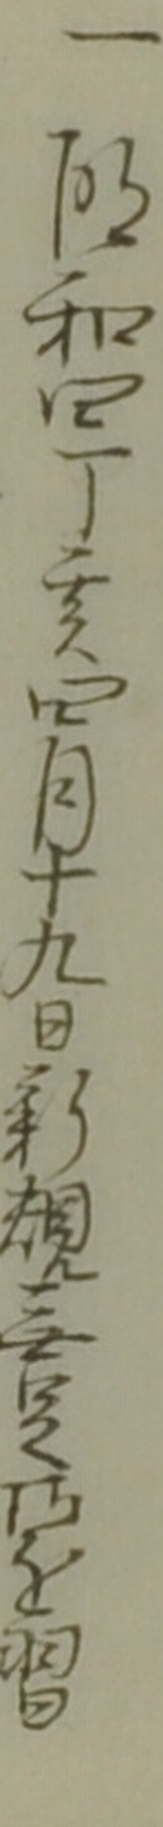一明和四丁亥四月十九日新規無足御近習
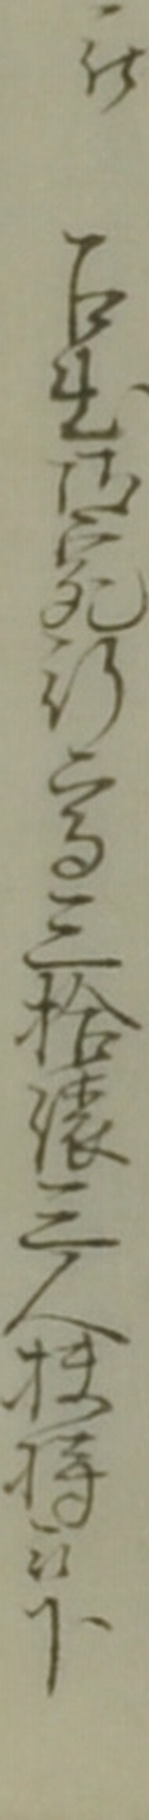被召出御宛行高三拾俵三人扶持被下
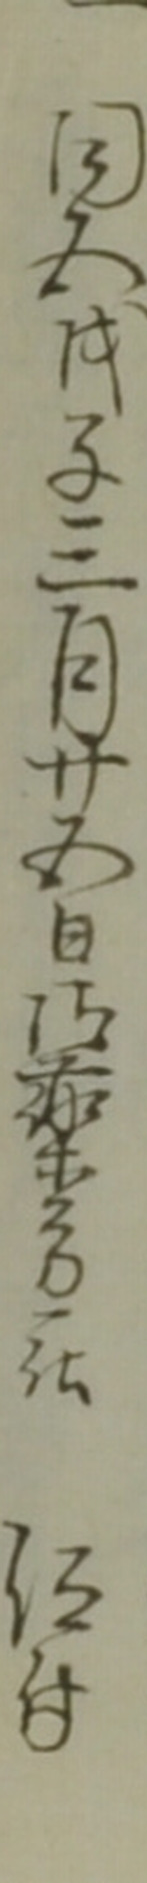一同五戊子三月廿五日御薬方被仰付
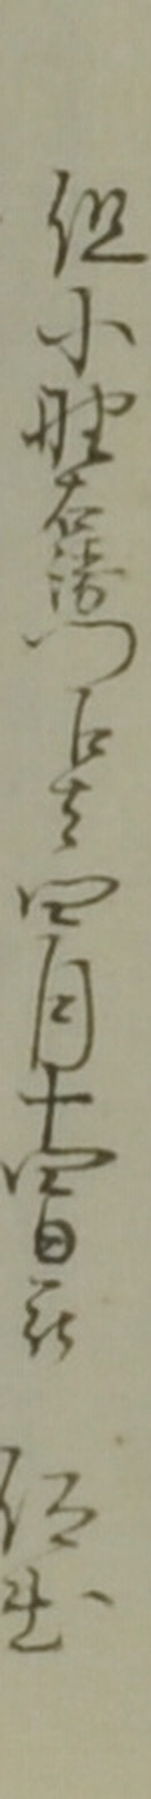但小野右衛門江者四月十四日被仰出
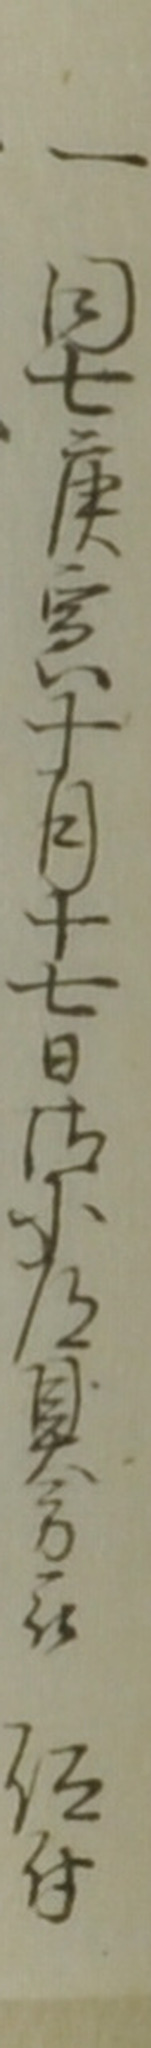一同七庚寅十月十七日御小道具方被仰付
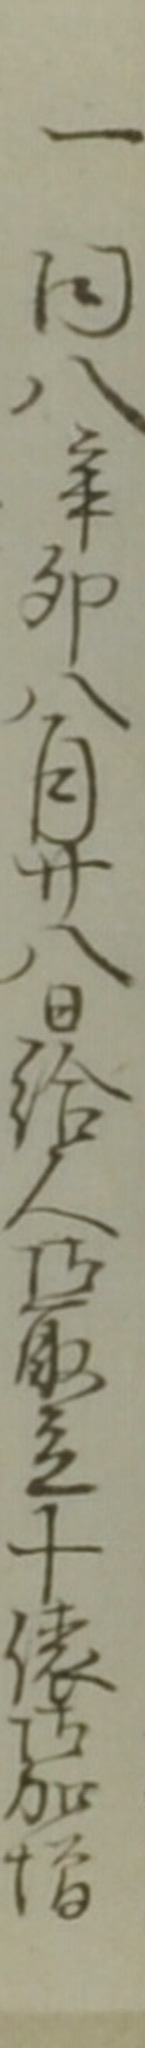一同八辛卯八月廿八日給人御取立十俵御加増
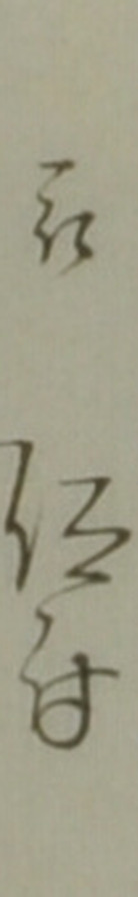被仰付
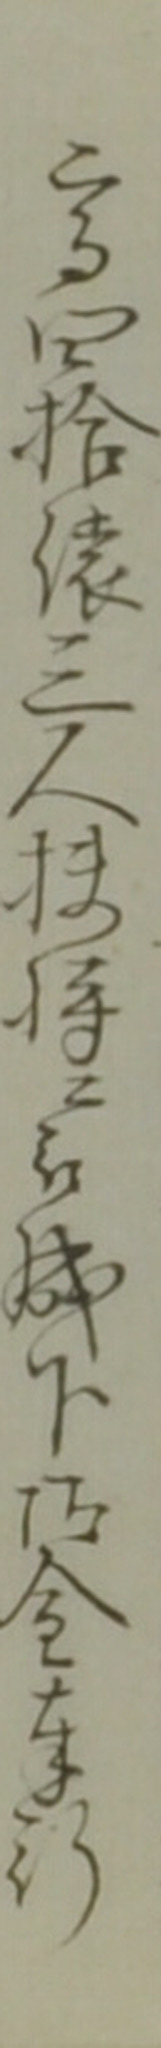高四拾俵三人扶持ニ被成下御金奉行
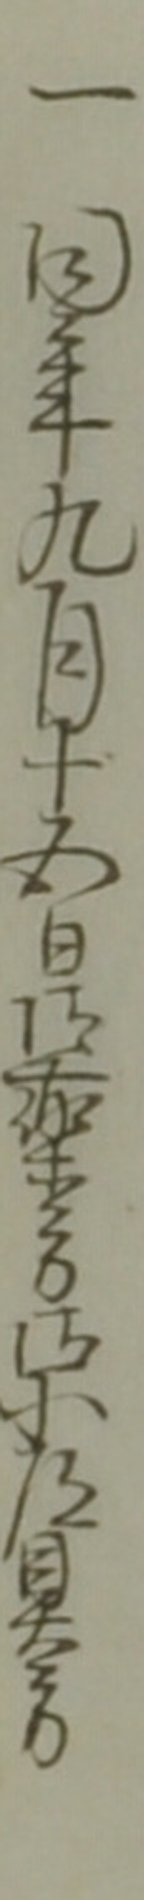一同年九月十五日御薬方御小道具方
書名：給人諸士勤仕録（三）
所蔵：伊那市立高遠町図書館・合同会社AMANE
